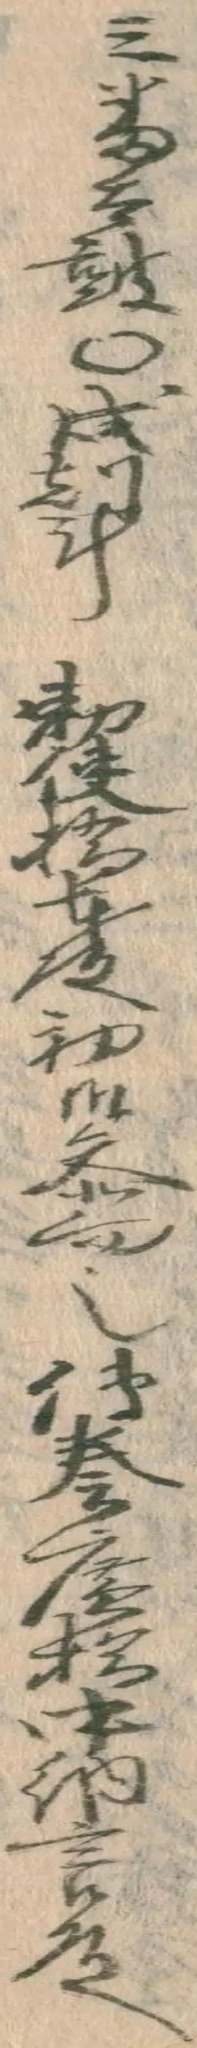三番太鼓◯戌刻斗勅使橋本殿初御参向也傳奏廣橋中納言殿
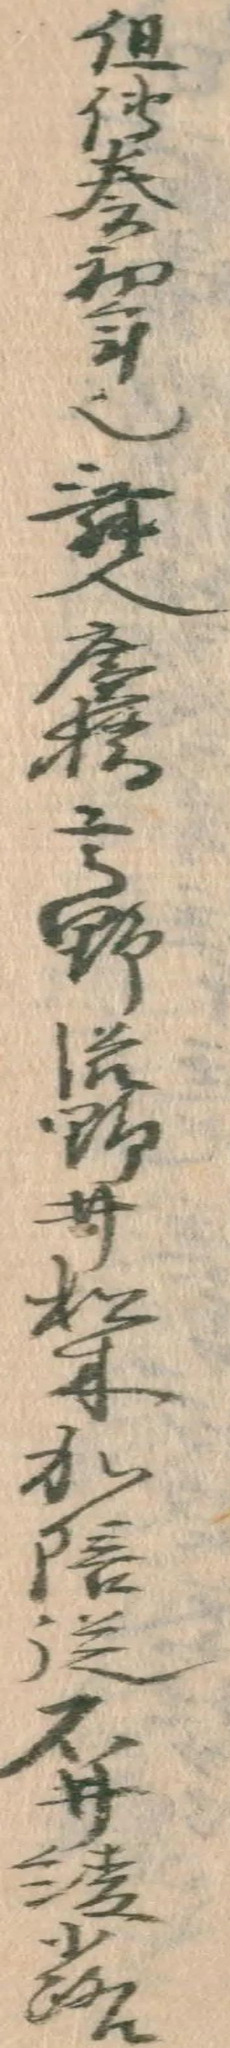但傳奏初年也舞唐橋高野滋野井松木加陪従石井綾小路
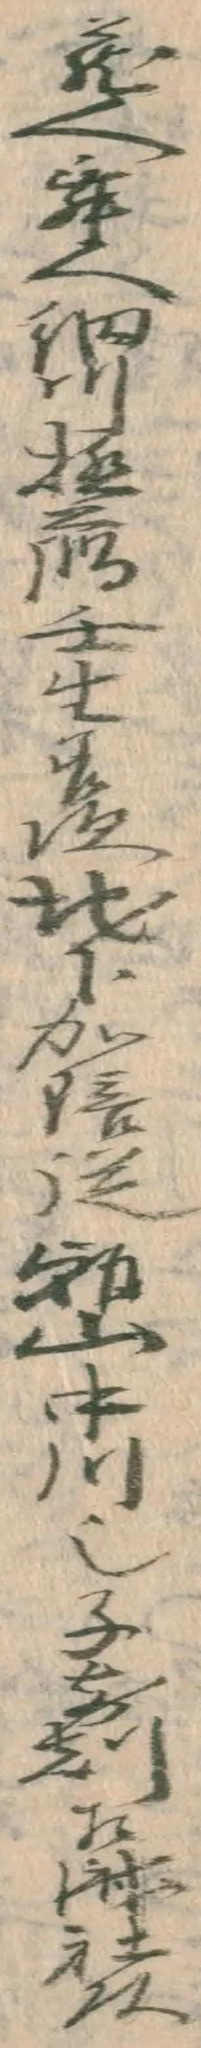蔵人舞人細川極臈壬生其次地下加陪従朝山中川也子前刻相済社頭
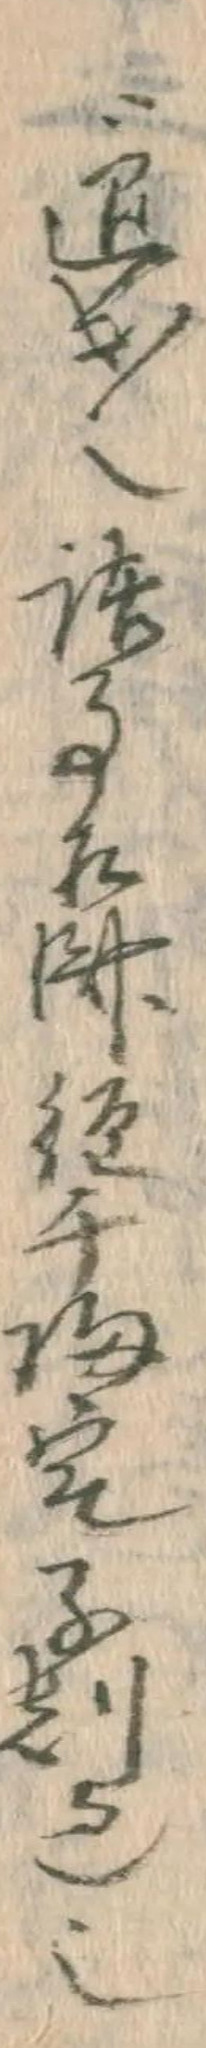御退出也諸事相済経千帰宅子刻過也
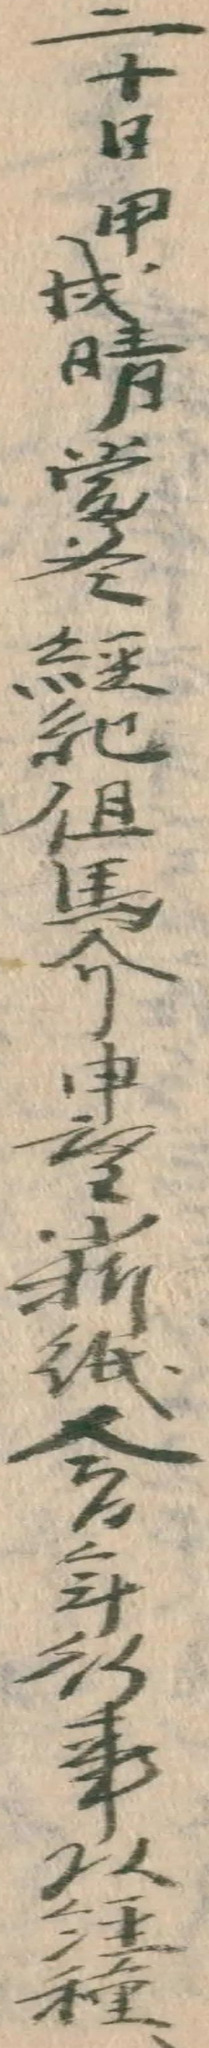三十日甲戌晴當冬経紀但馬介申望小折紙今日年行事頭経種へ
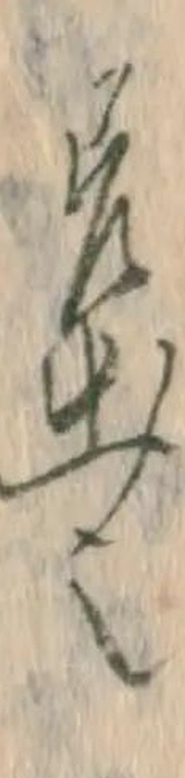差出也
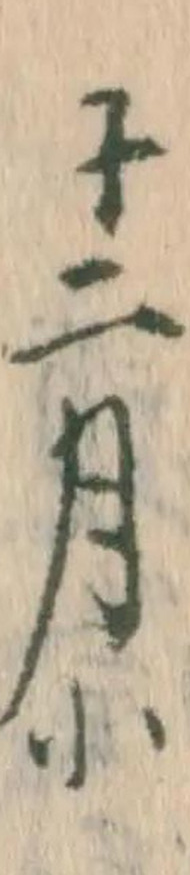十二月小
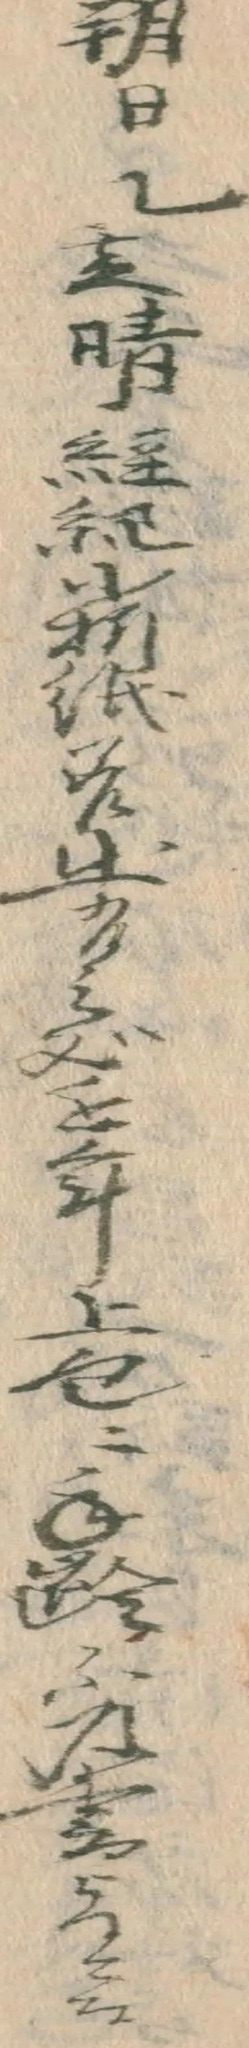朔日乙亥晴経紀小折紙差出有之処近年上包二年齢不及書旨ニ而
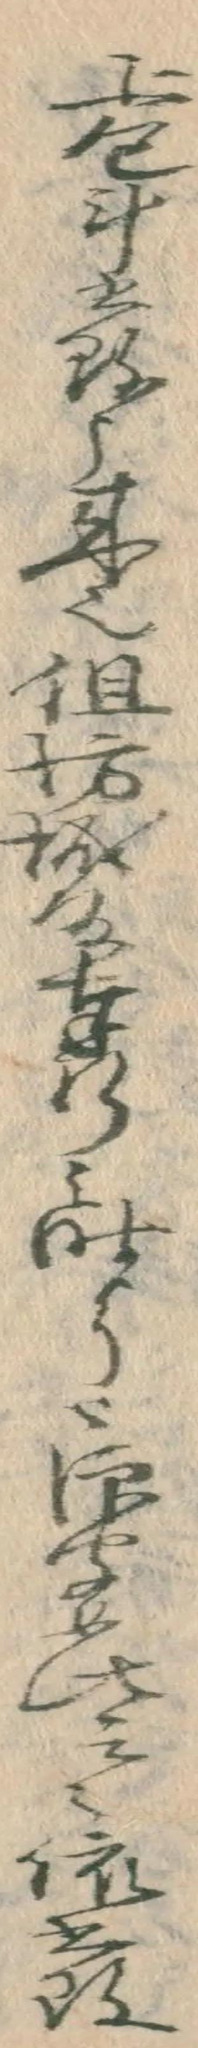上包斗書改申来也但坊城殿奉行之時より被仰聞如此云々依書改
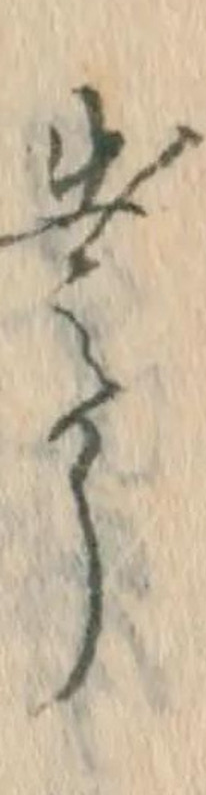出之了
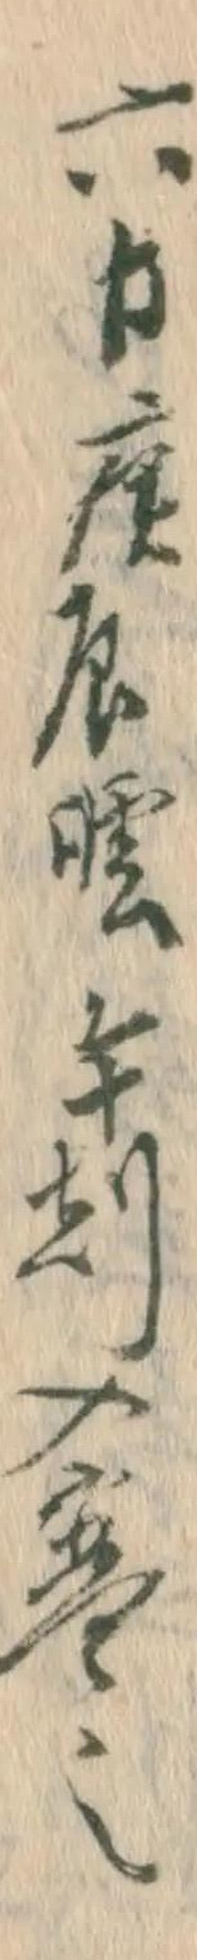六日庚辰曇午刻入寒也
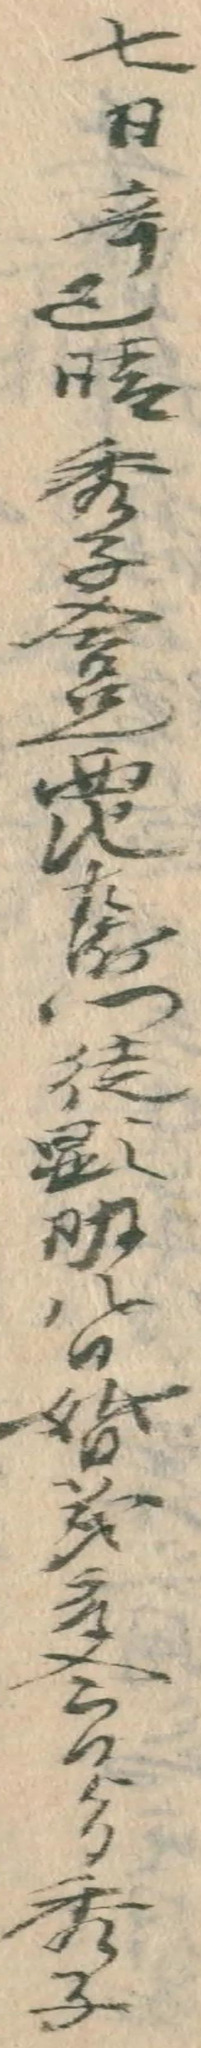七日辛巳晴秀子舎兄西池左衛門徒顕明八日婚義ニ付今日より秀子
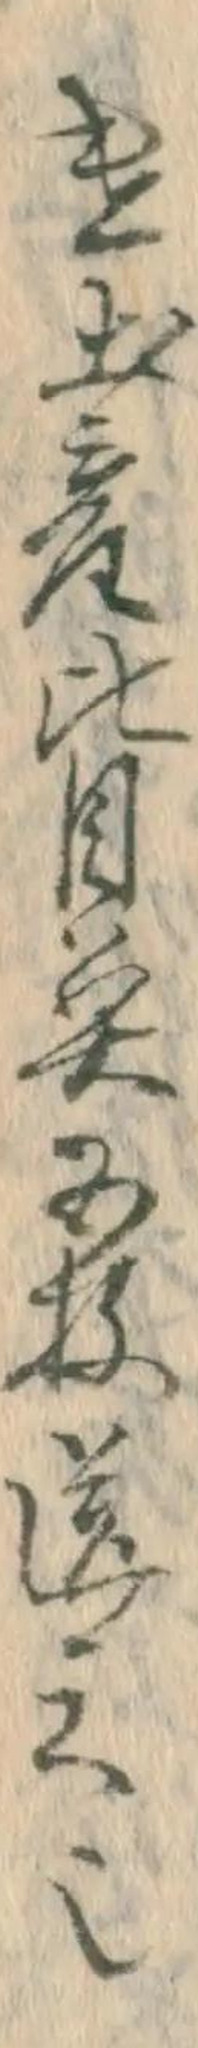遣土産比目魚五枚送之也

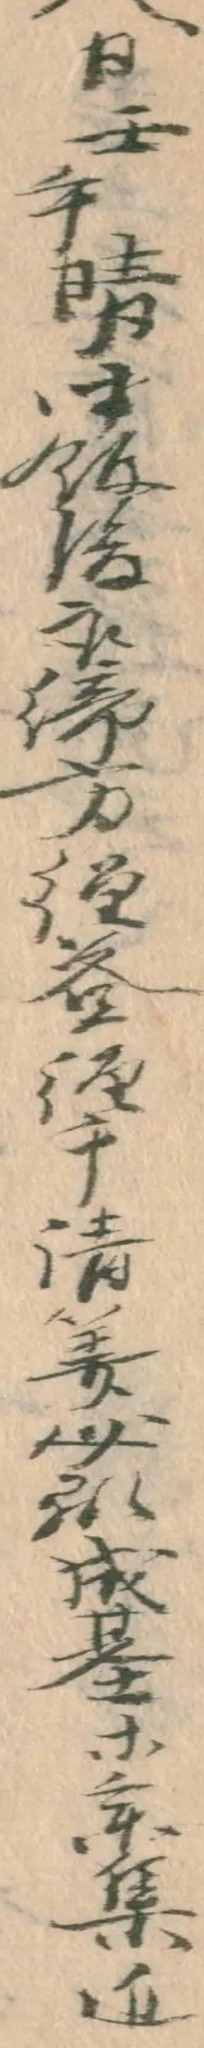八日壬午晴中飯後取締方経益経千清算必顕成基等参集近
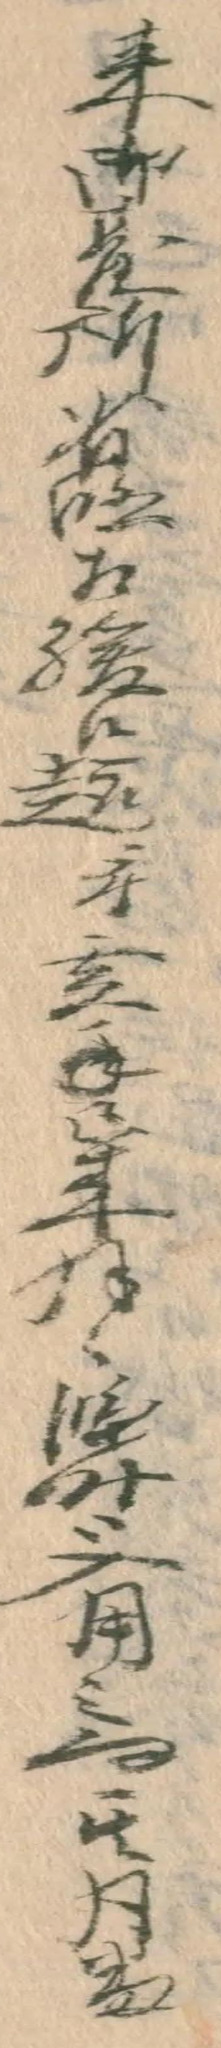来御䑓所省略相緩候趣ニ付亥年已来月々臨時御入用之向其月番
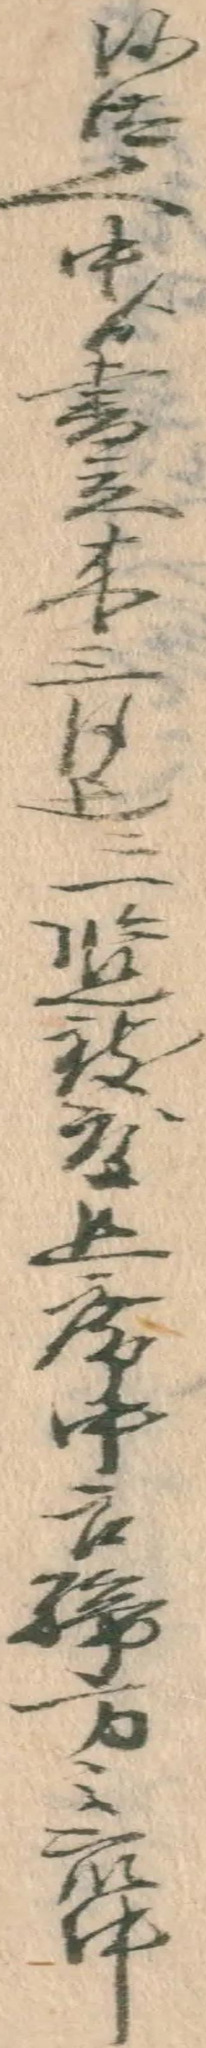沙汰人中ゟ書立来三月迄ニ一覧致度且席中取締方之衆中
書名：賀茂社記録. 第69冊
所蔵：国立国会図書館 National Diet Library, JAPAN
